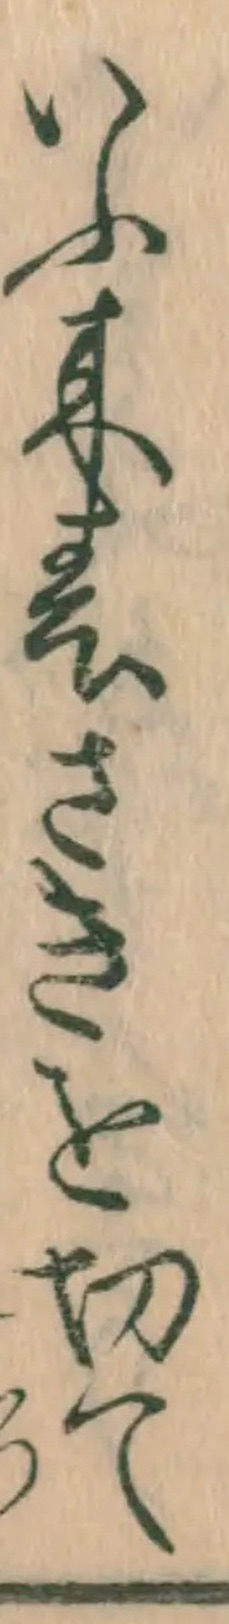いふ来春さきを切て
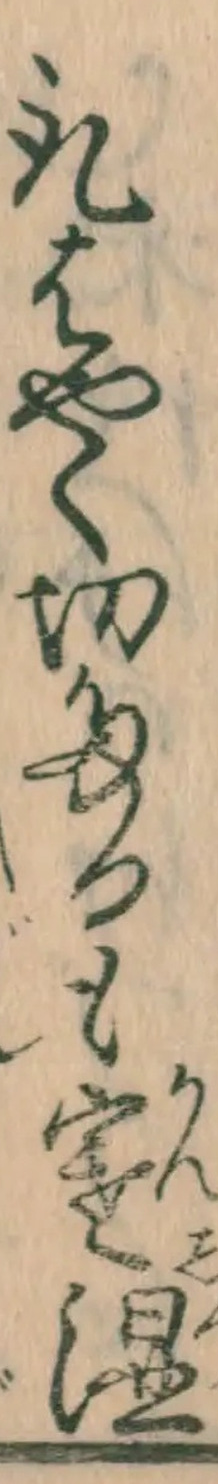取はやく切たるも寒湿
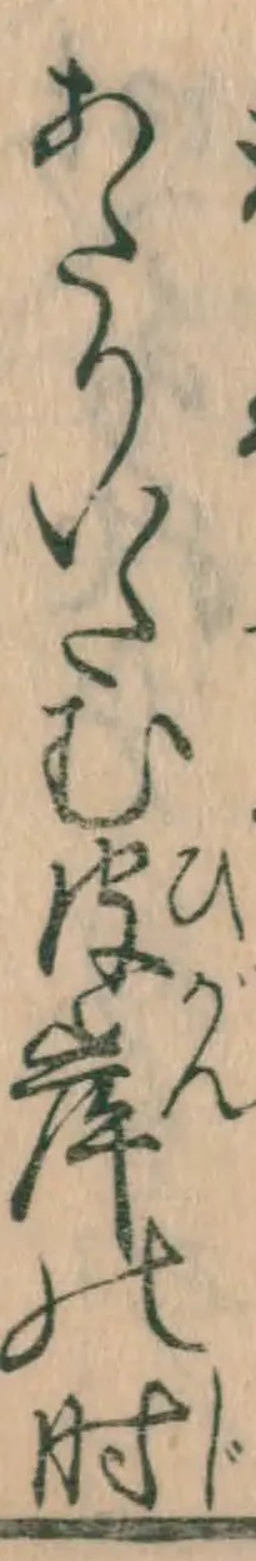あたりいたむ皮岸の時
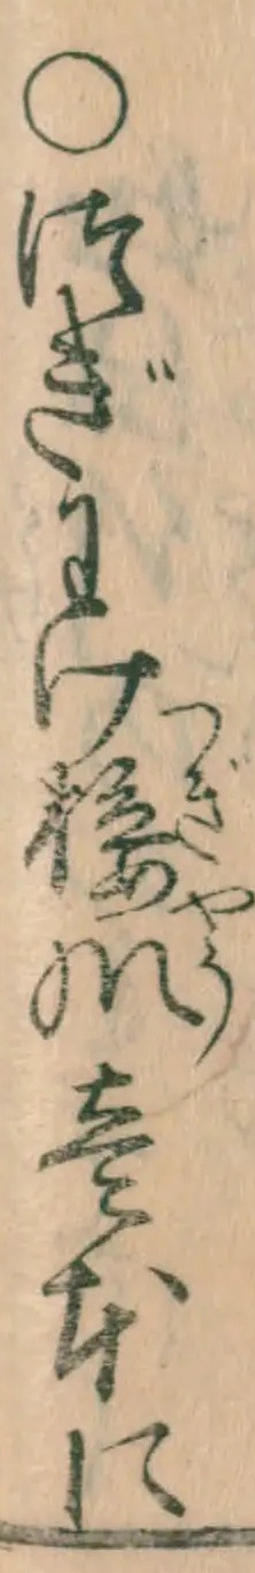○つぎわけ接様壱本に
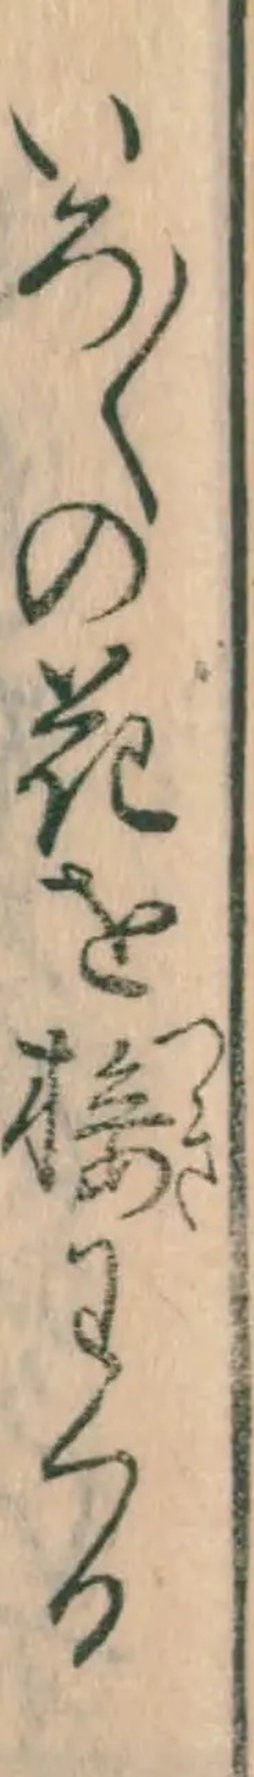いろ〳〵の花を接わくる
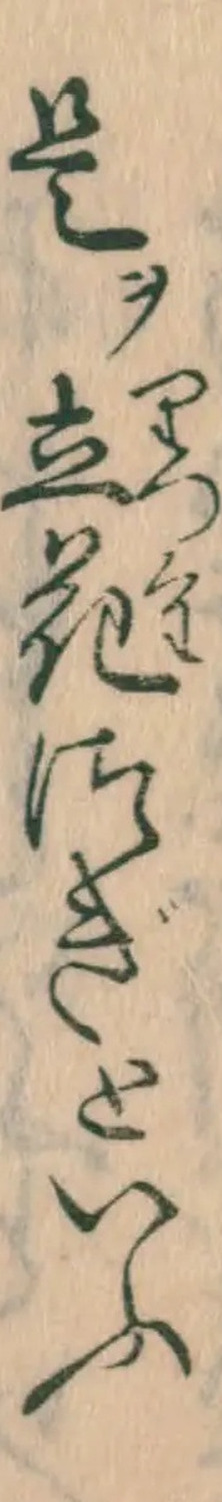是立花つぎといふ
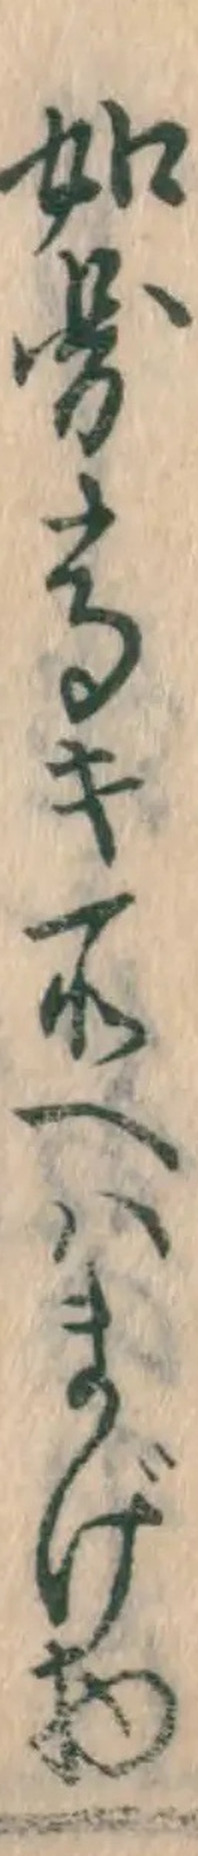如図高所へはまげ物
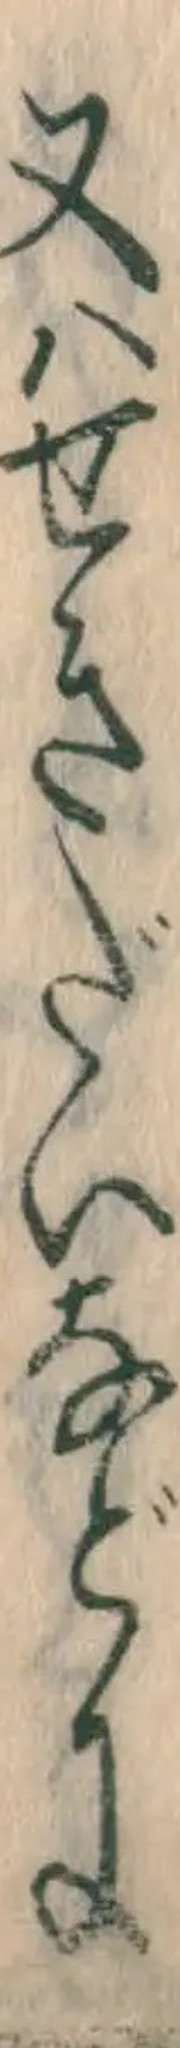又はせきだいなどに
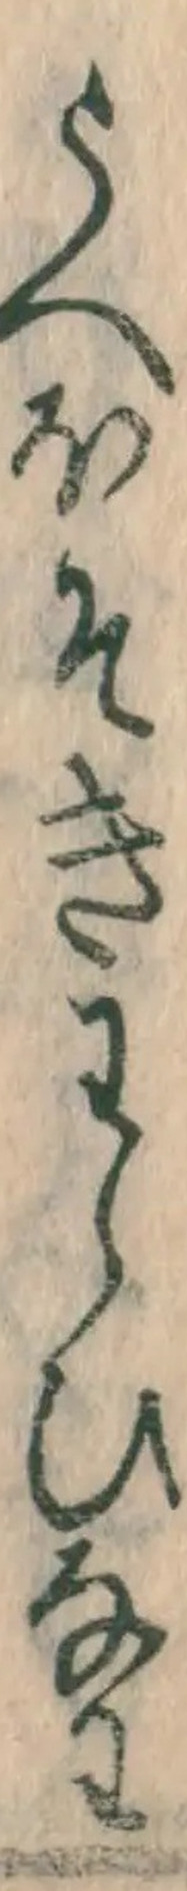うへほそきわらひなわ

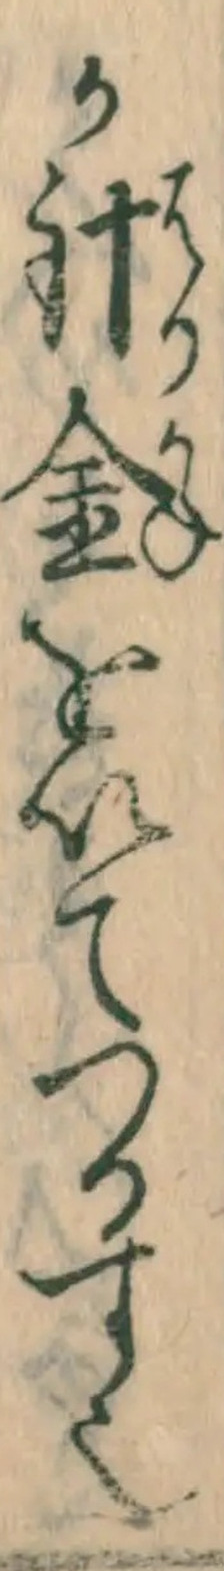か針金を以てつるす也
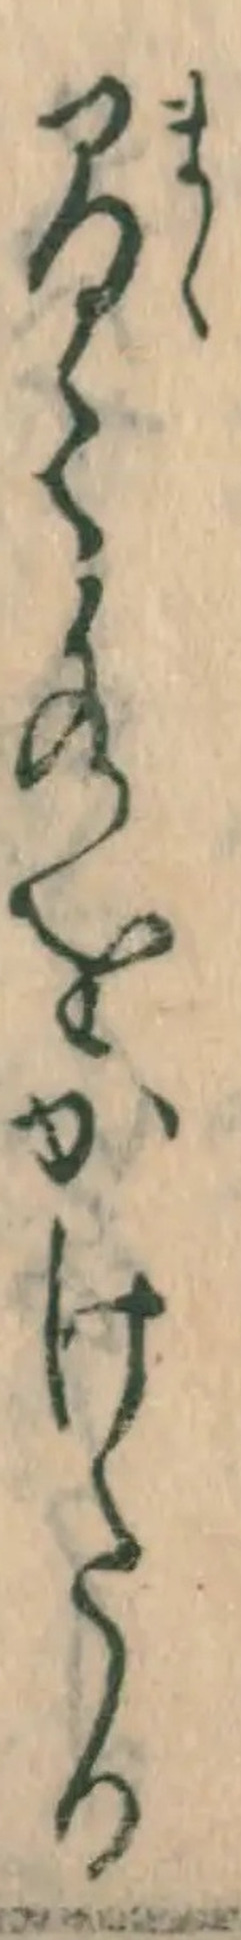間に水をかけたる
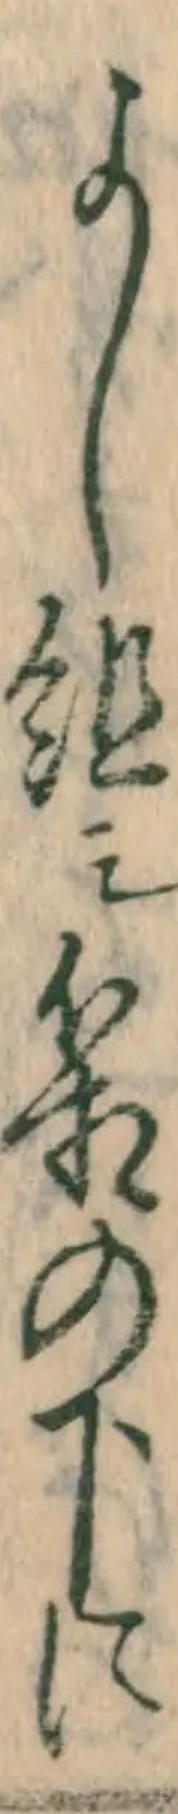よし組箱の下に
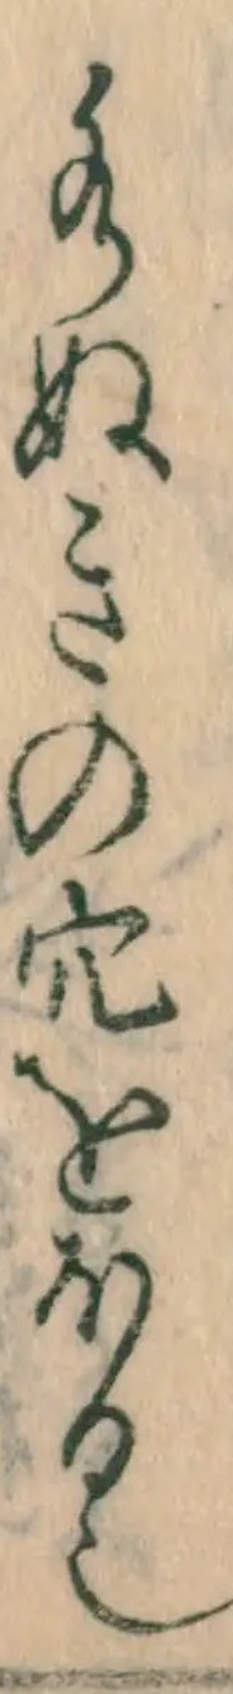水ぬきの穴をほる也
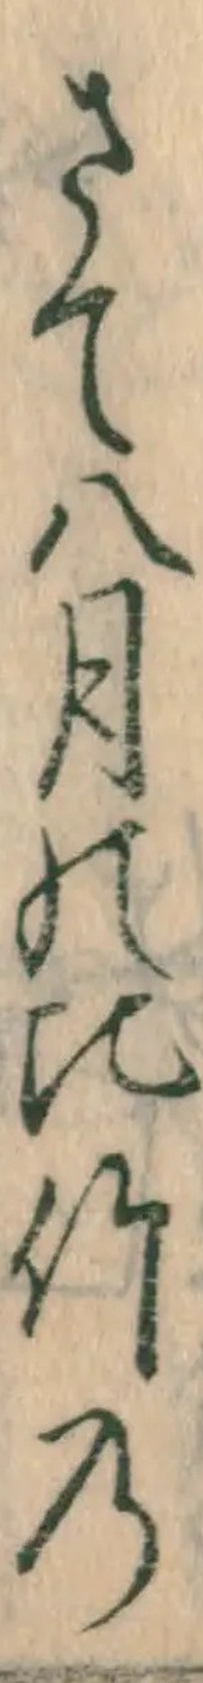さて八月の頃竹の
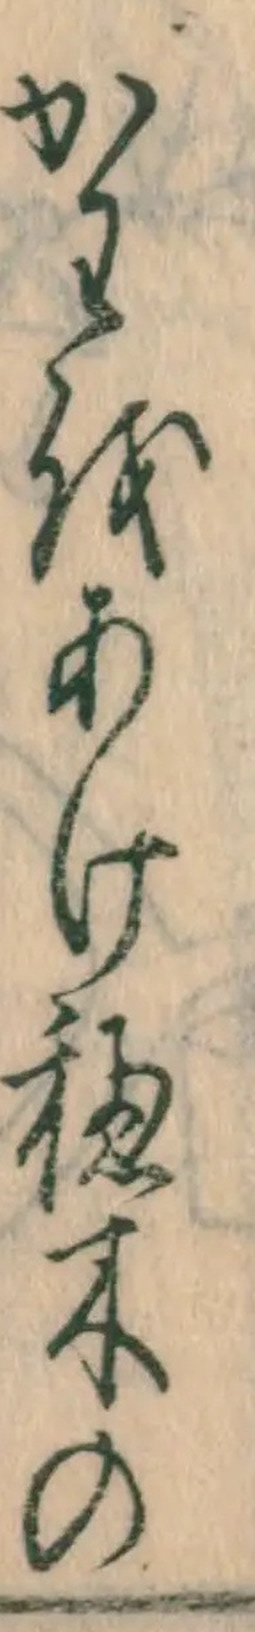かわをあけ穂木の
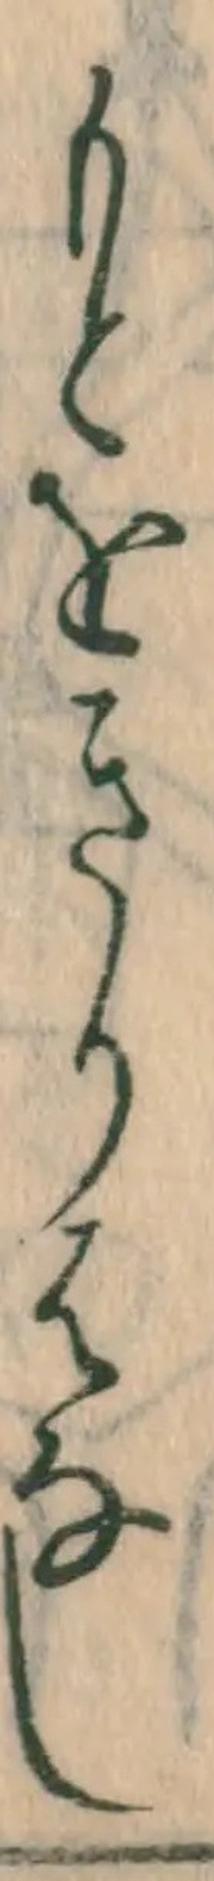もとをきりはなし
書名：錦繍枕 5巻. [5]
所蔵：国立国会図書館 National Diet Library, JAPAN
